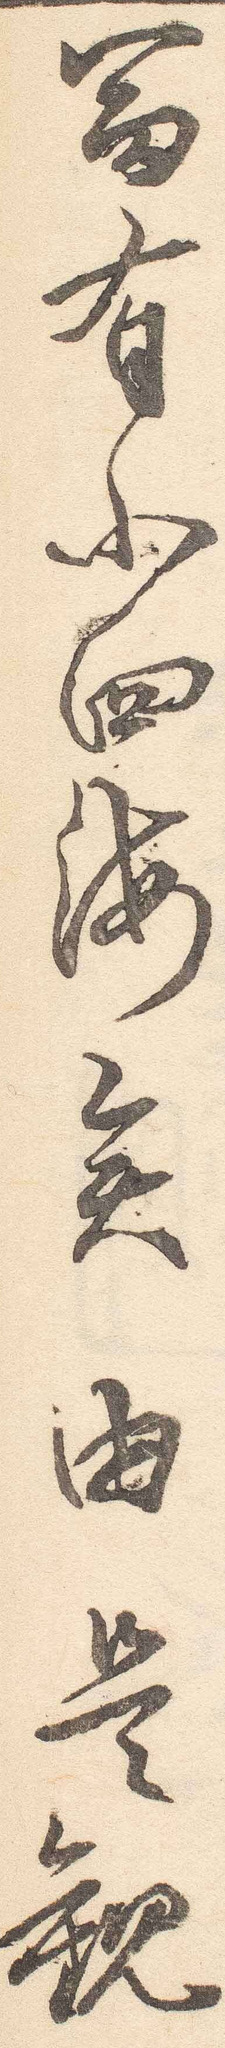富有小四海矣由是観
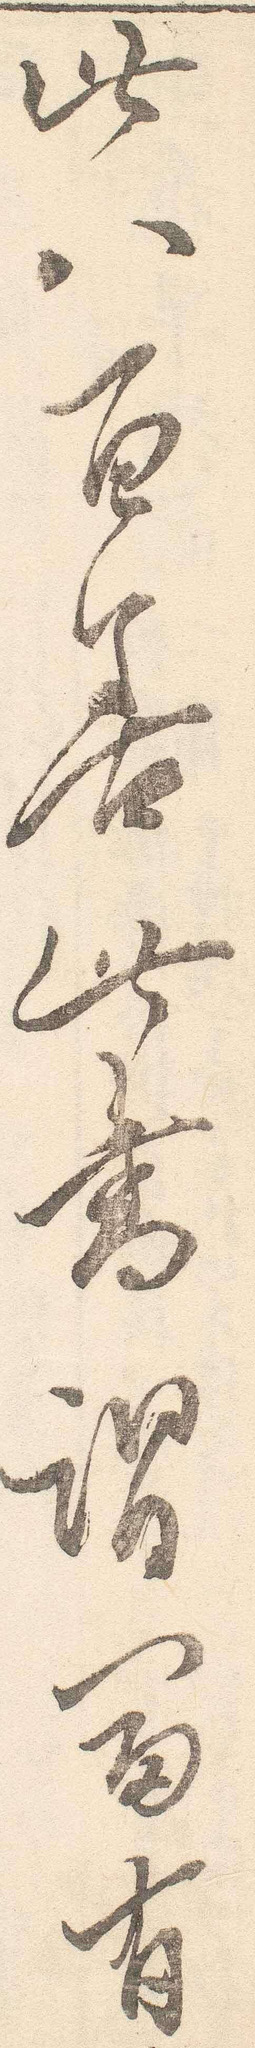此八百善此書謂富有
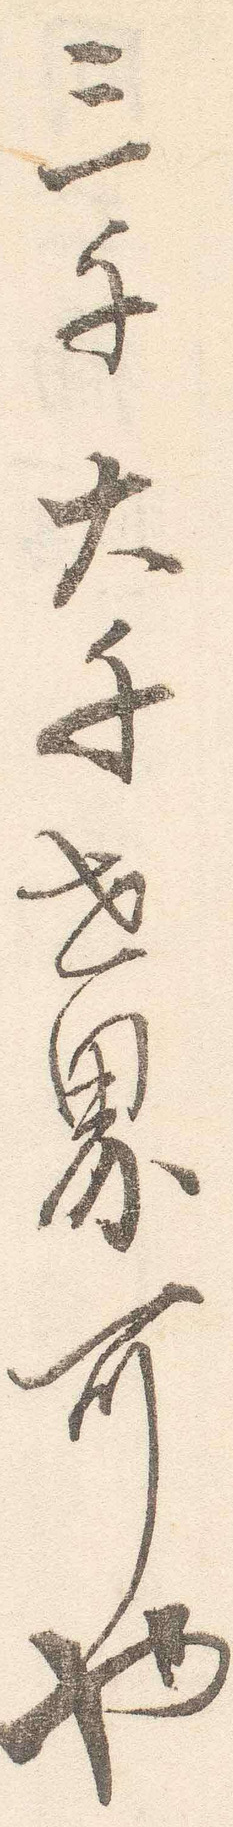三千大千世界可也
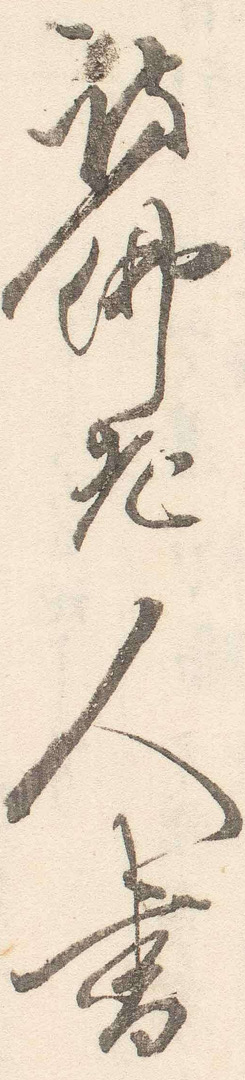詩仏老人書

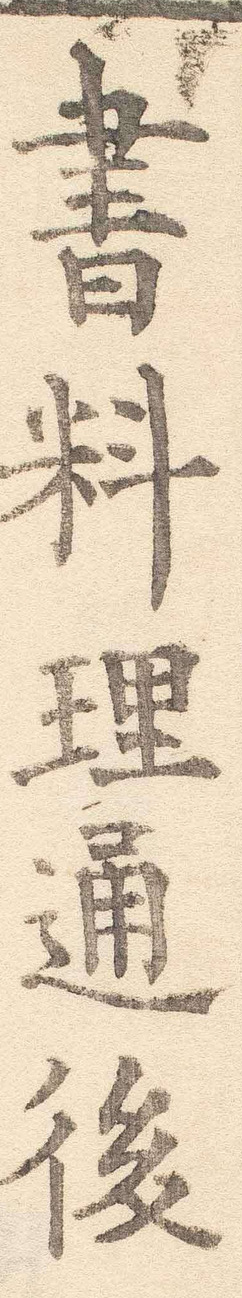書料理通後
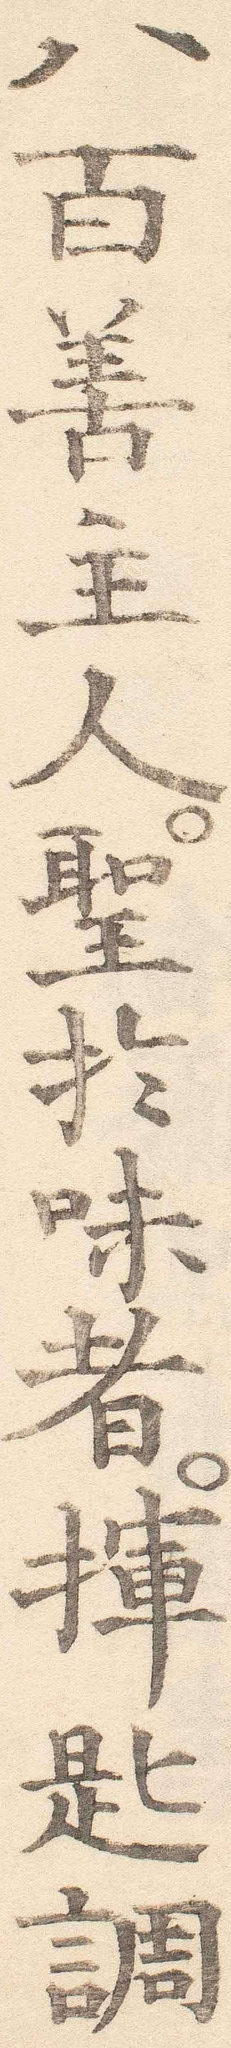八百善主人。聖於味者。揮匙調
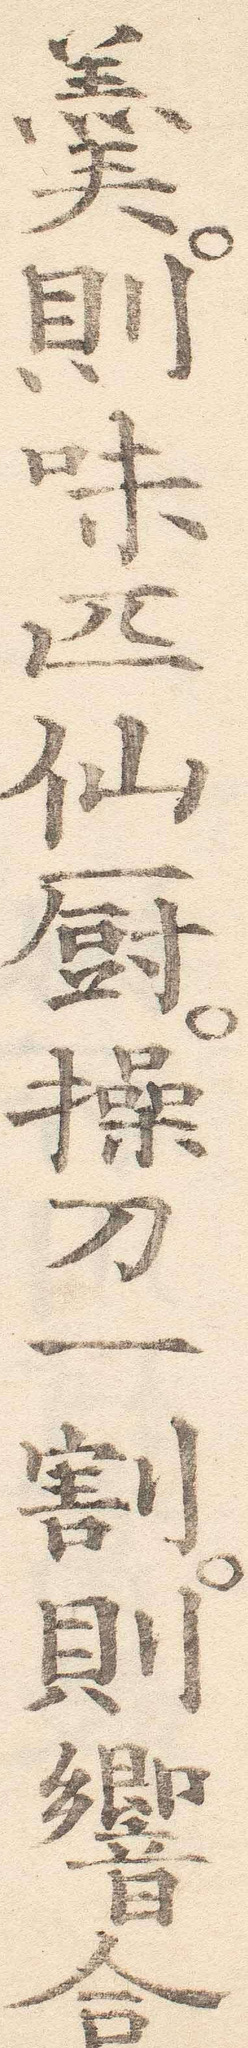羮。則味匹仙厨。操刀一割。則響合
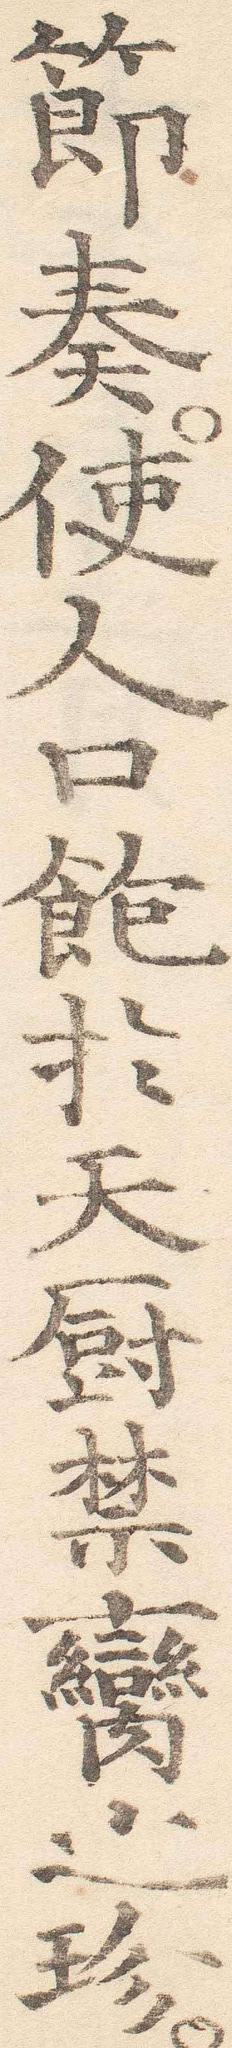節奏。使人口飽於天厨禁之珍。
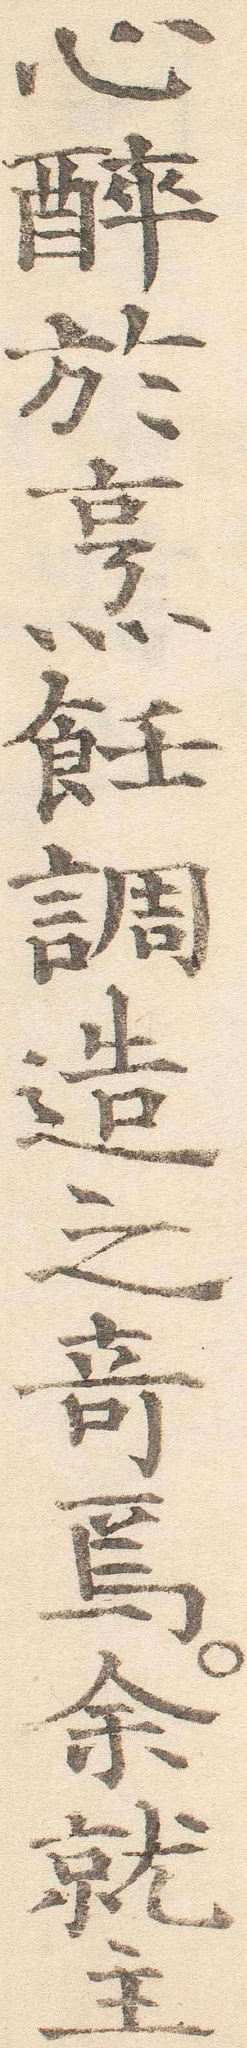心醉於烹飪調造之竒焉。余就主
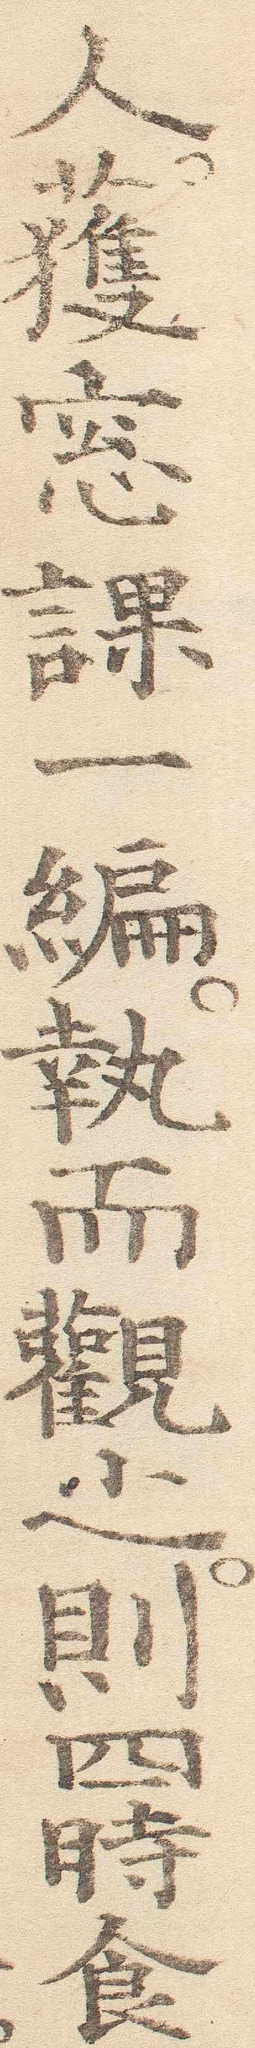人。獲窓課一編。執而觀之。則四時食
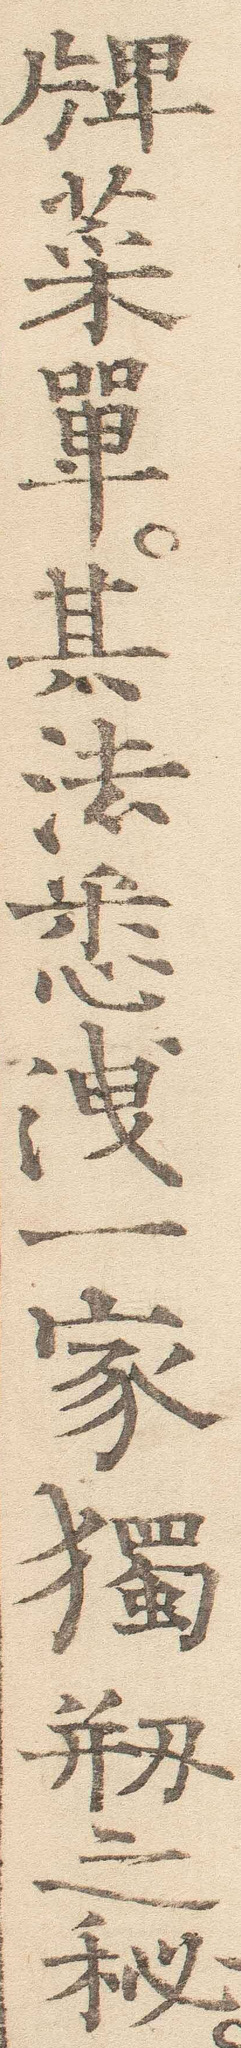牌菜單。其法悉洩一家獨剏之秘。

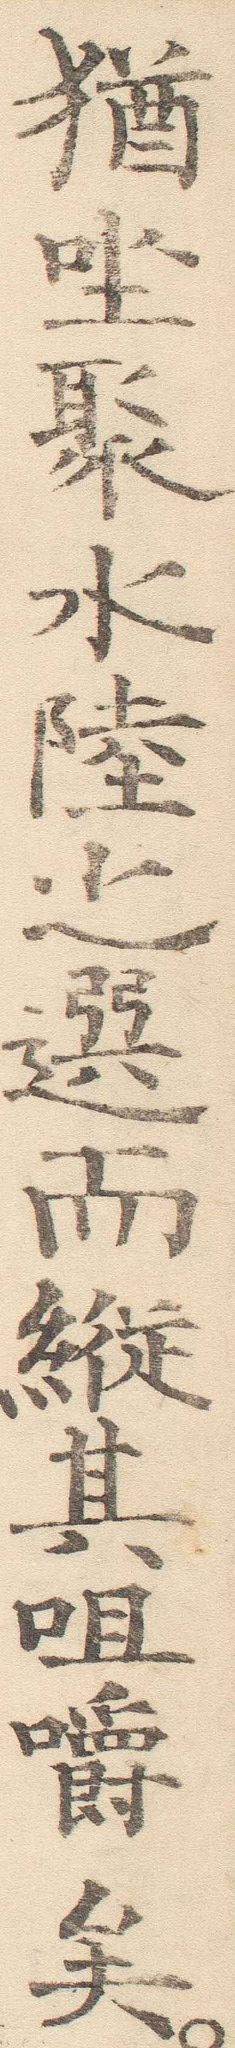猶坐聚水陸之選而縦其咀嚼矣。
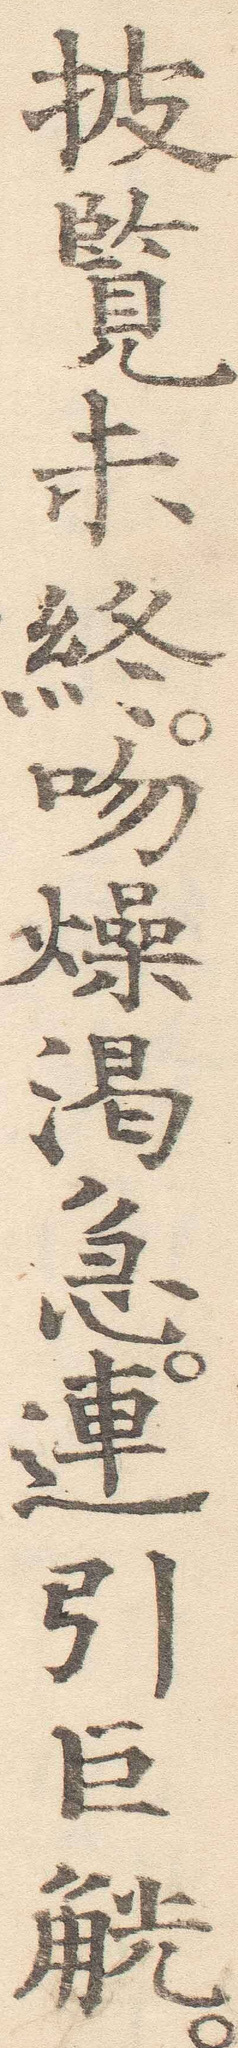披覧未終。吻燥渇急。連引巨觥。
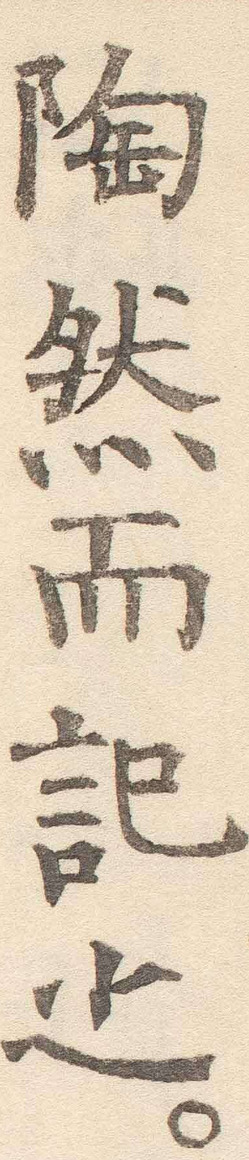陶然而記之。
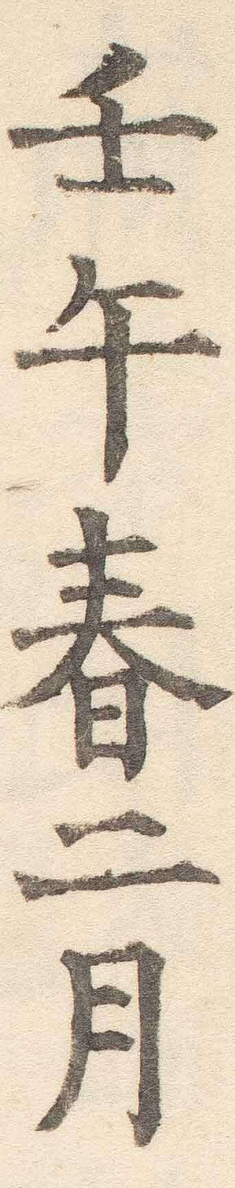壬午春二月
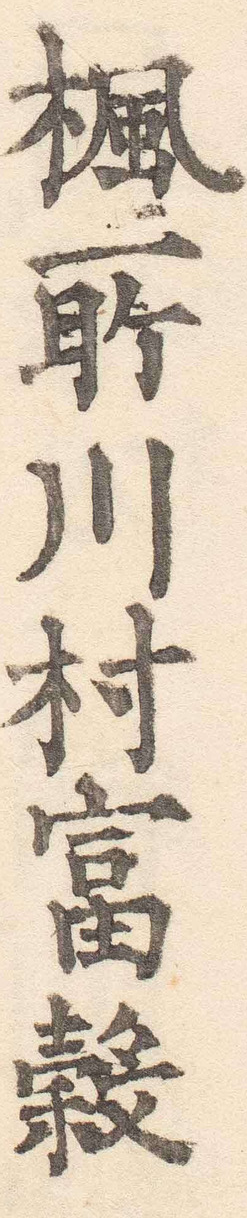楓所川村富穀
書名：料理通
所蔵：東京学芸大学附属図書館 国文学研究資料館
